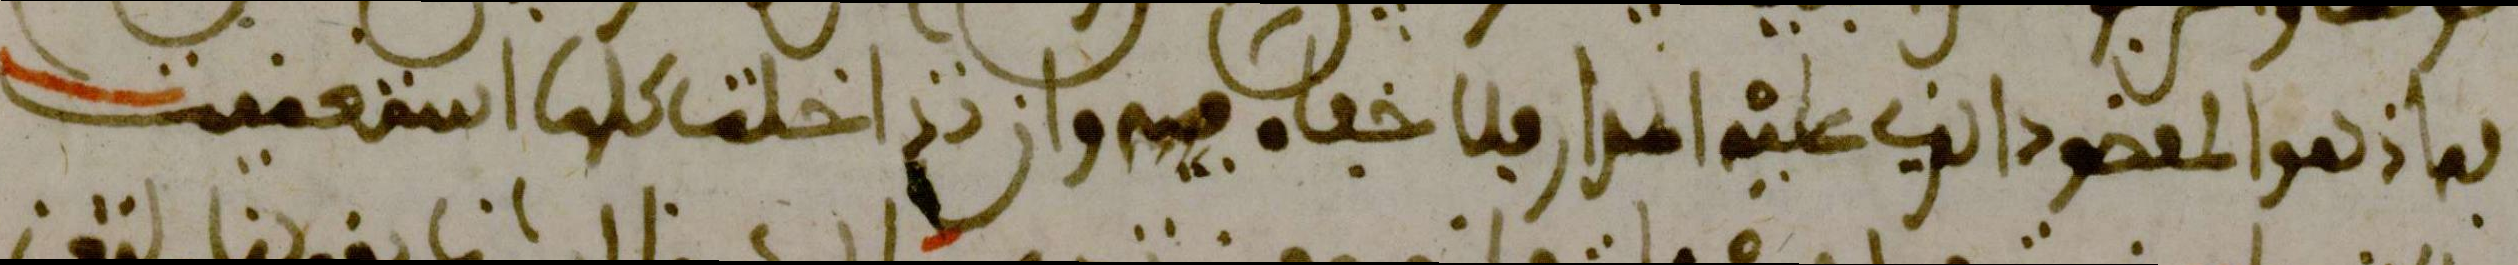به اذ هو المقصود الذي عليْه المدار فلا خفاء فيه وان تداخلت كلها استغنيتَ
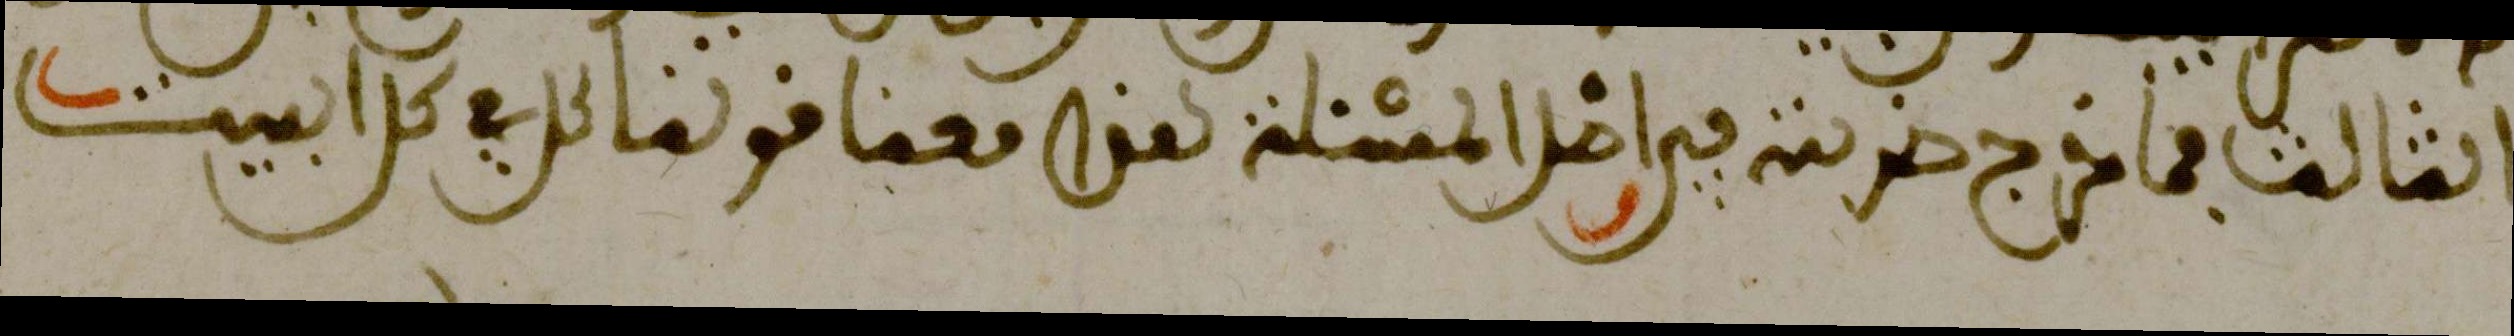الثالث فما خرج ضربته في اصْل المسْئلة هذا معنا قولنا كل في كل البيت
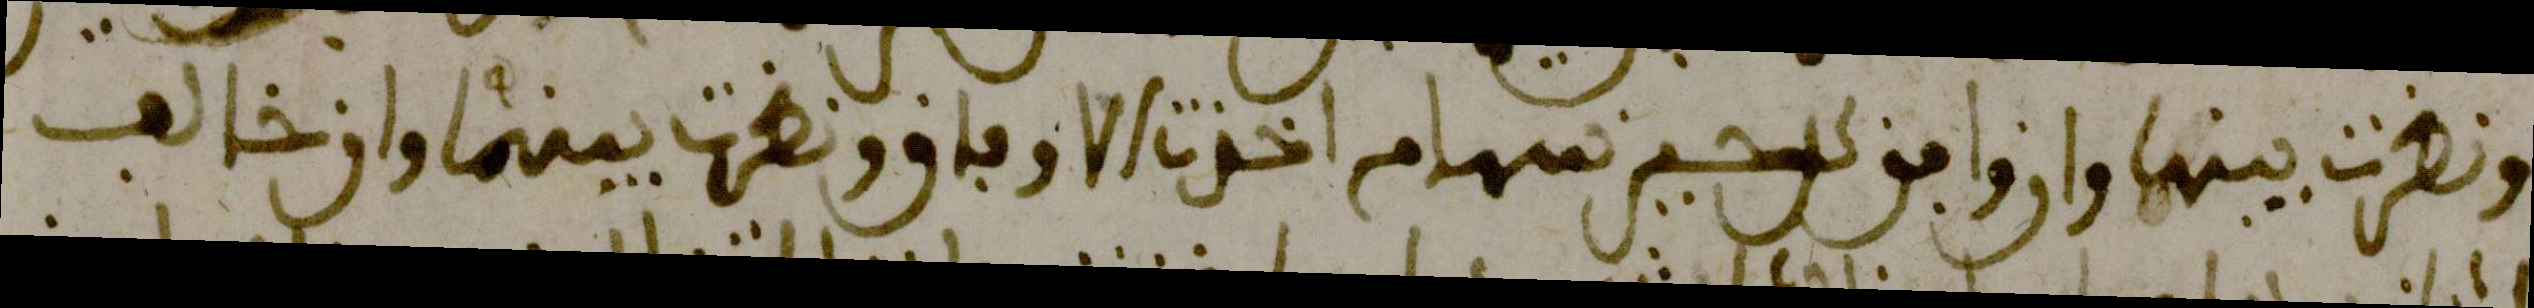ونظرت بينها وان وافق كل حيز سهامه اخذت الاوفاق ونظرت بينها وان خالف
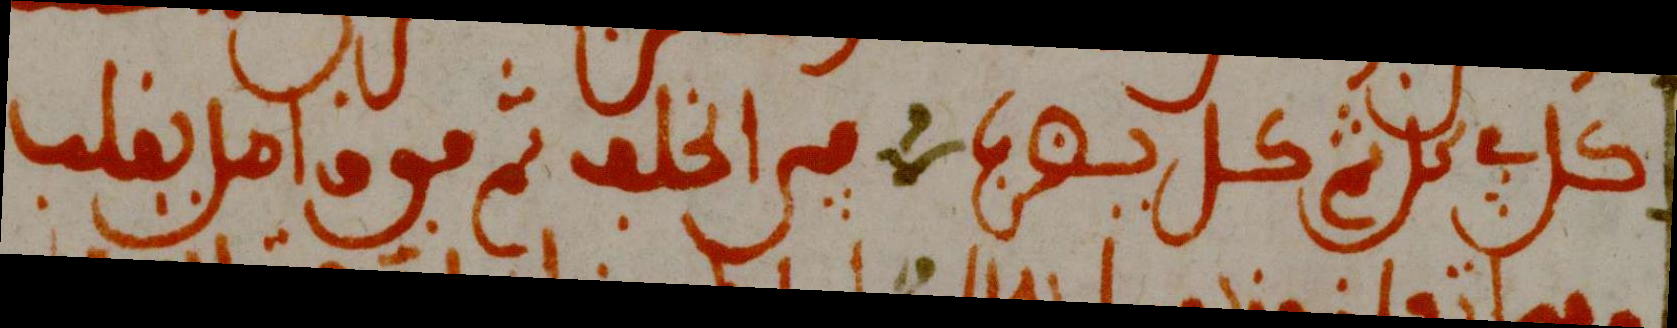كل في كل ثم كل يضرب في الخلف ثم فوق اصل يقلب
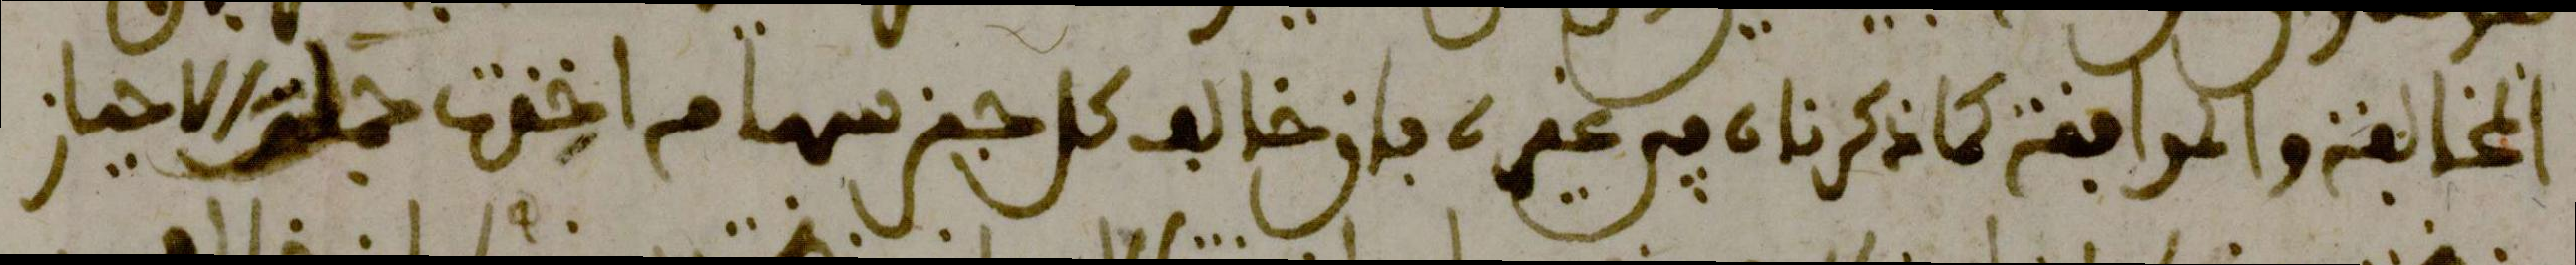المخالفة والموافقة كما ذكرناه في غيره فان خالف كل حيز سهامه اخذت جملة الاحياز
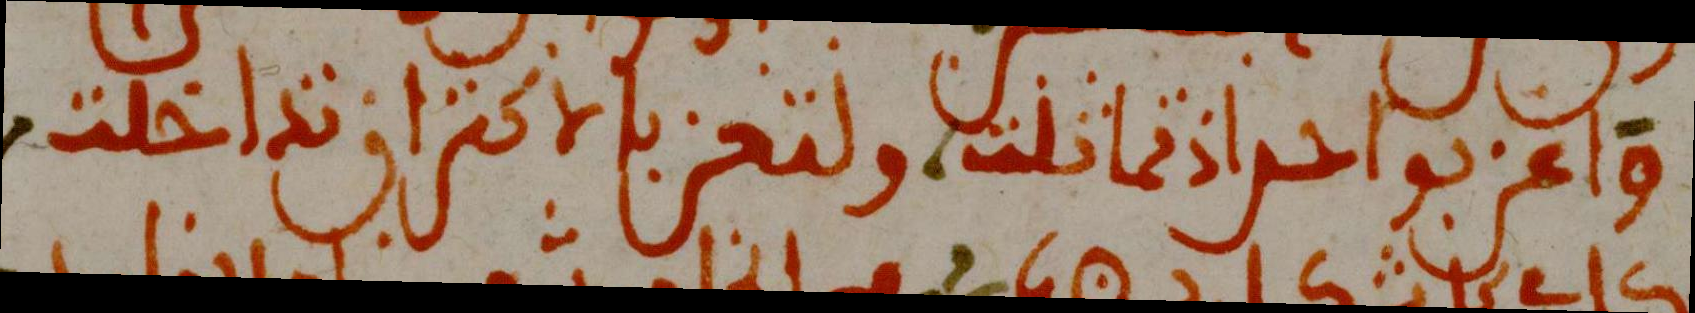وَاغن بواحد اذا تما ثلث ولتغن بالاكثر ان تداخلت
